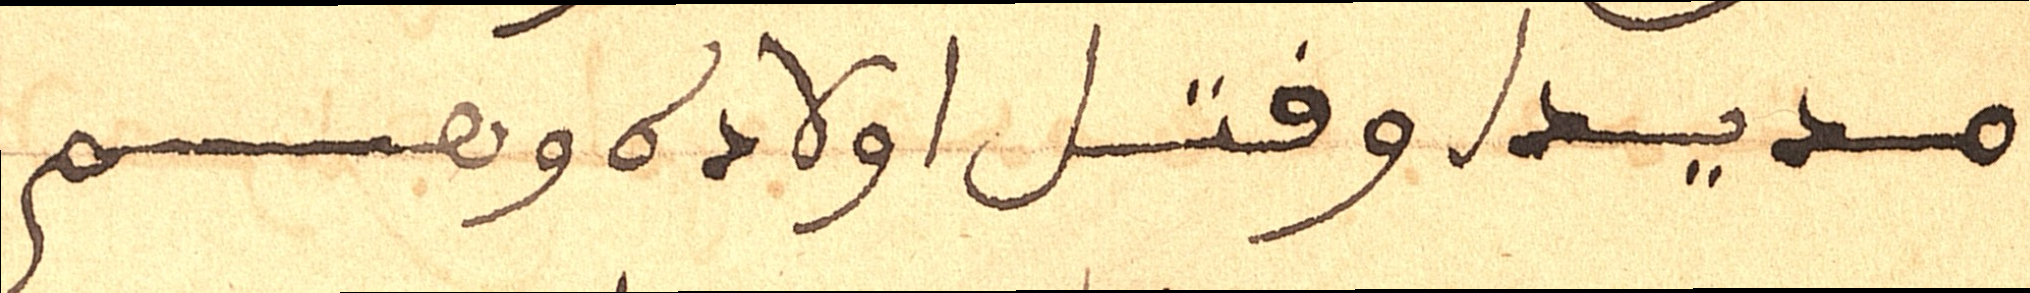مديدا وقتل اولاده وهم
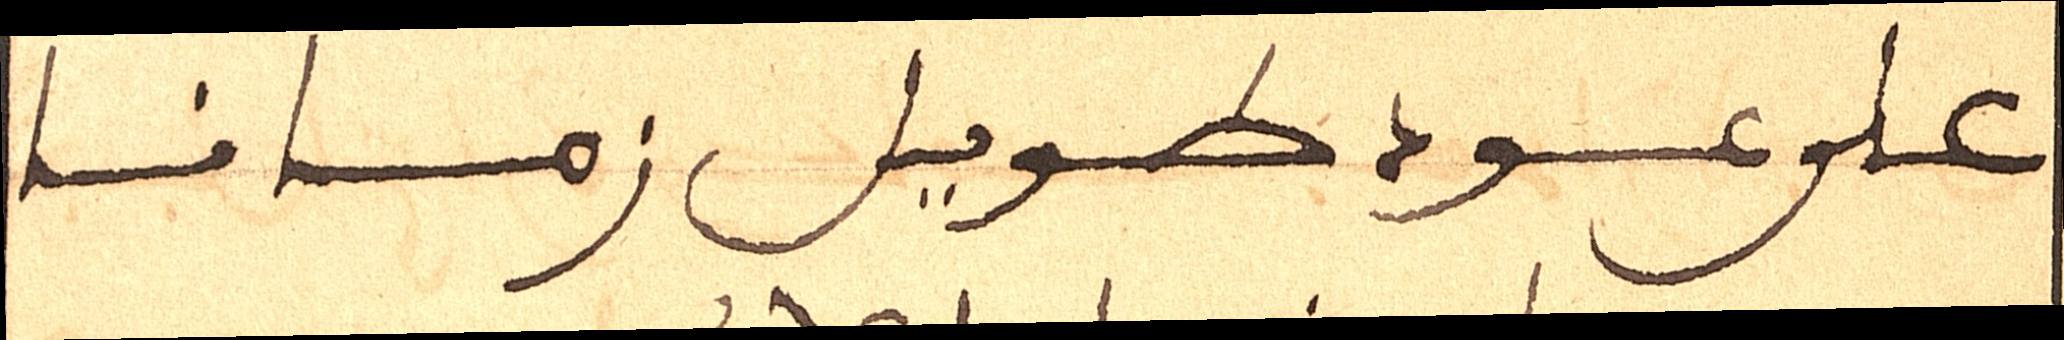على عود طويل زمانا
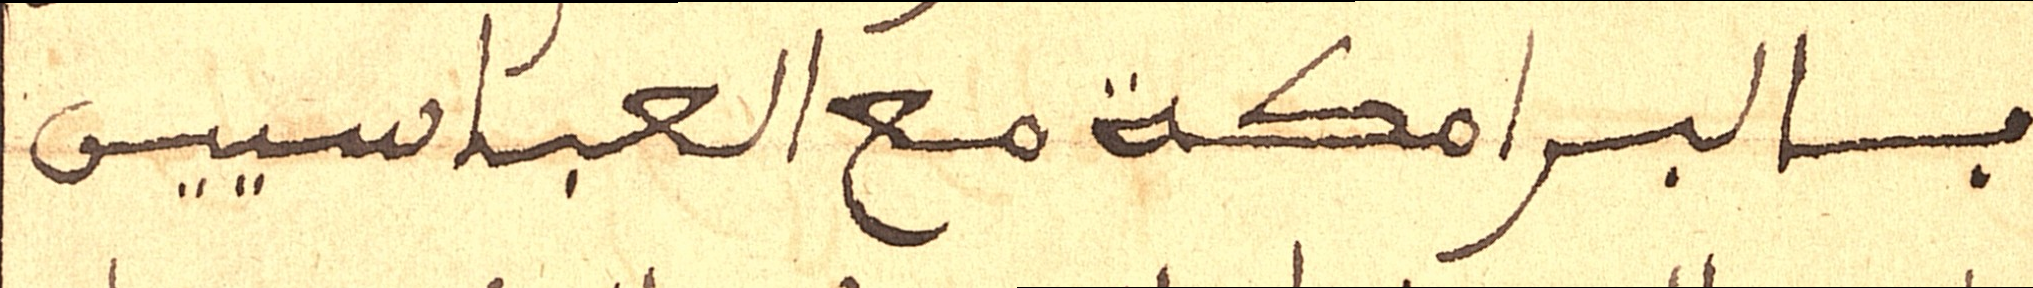بالبرامكة مع العباسيين
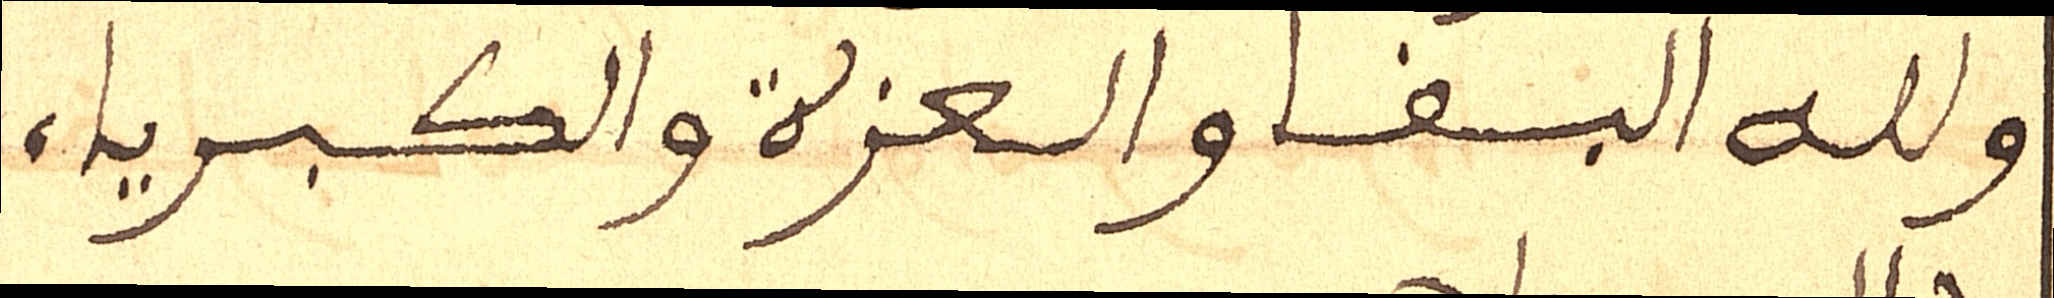ولله البقا والعزة والكبرياء
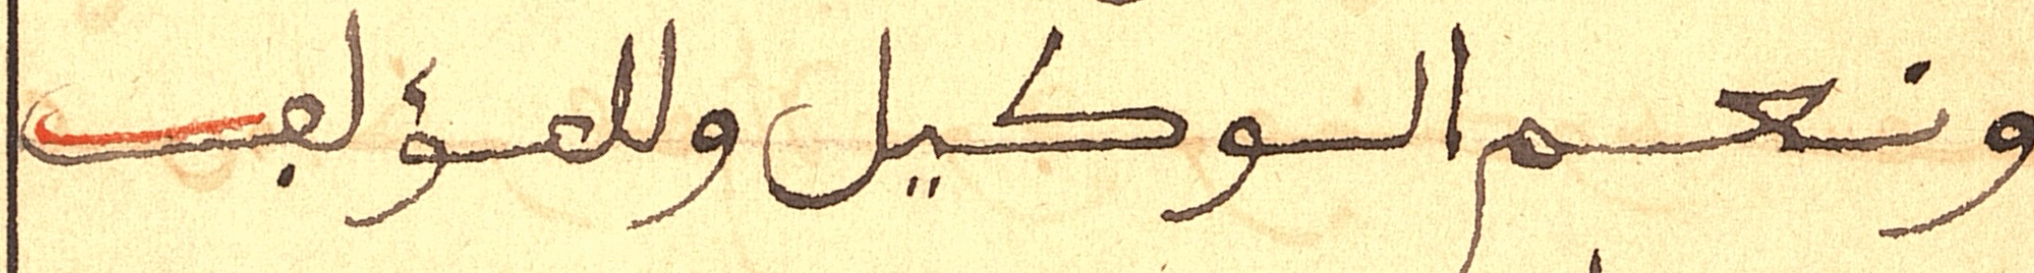ونعم الوكيل وللمؤلف
